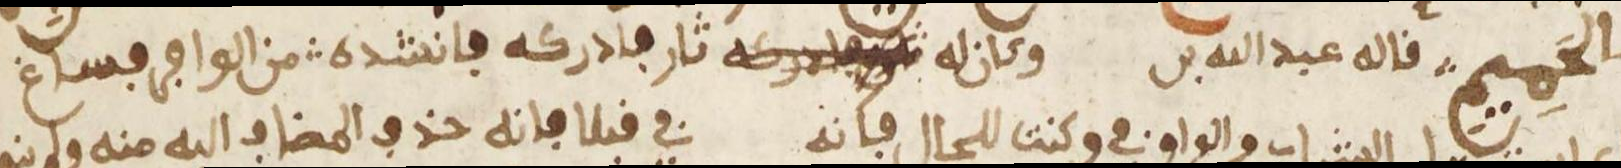الحميم قاله عبد الله بن و كان له ثار فادركه فانشده من الوافر فساغ
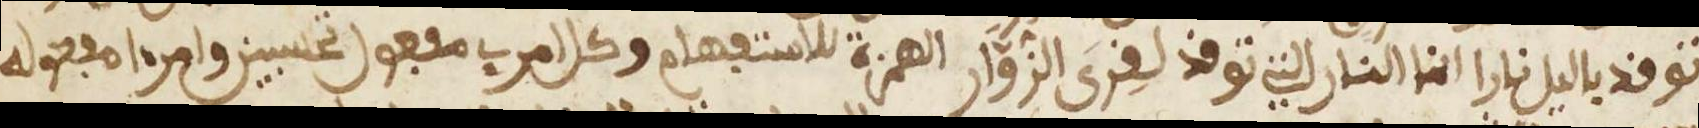توقد باليل نارا انما النار التي توقد لقرى الزوار الهمزة للاستفهام وكل امرئ مفعول تحسبين و امرءا مفعوله
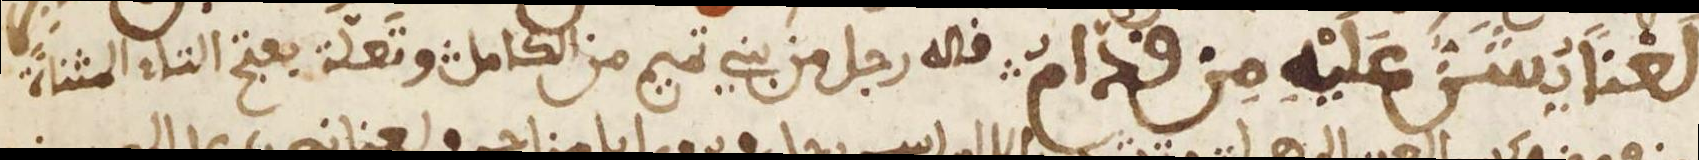لعنا يشن عليه من قدام قاله رجل من بني تميم من الكامل و تعلة بفتح التاء المثناة
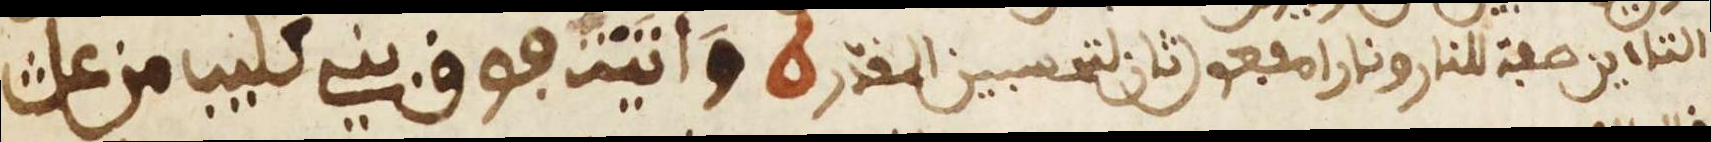التاءين صفة للنار و نارا مفعول ثان لتحسبين المقدرة ه و أتيت فوق بني كليب من عل
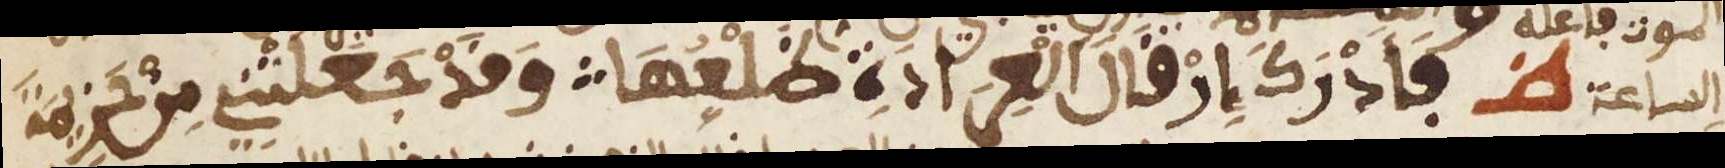الساعة ظ فأدرك إرقال العرادة ظلعها و قد جعلتني من حزيمة
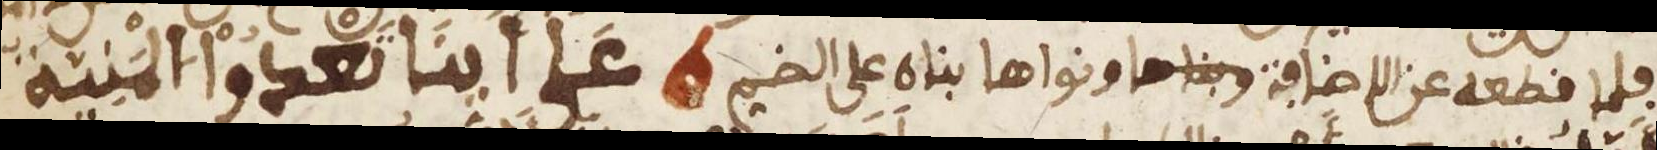فلما قطعه عن الاضافة و نواها بناه على الضم ه على أينا تعدوا المنية
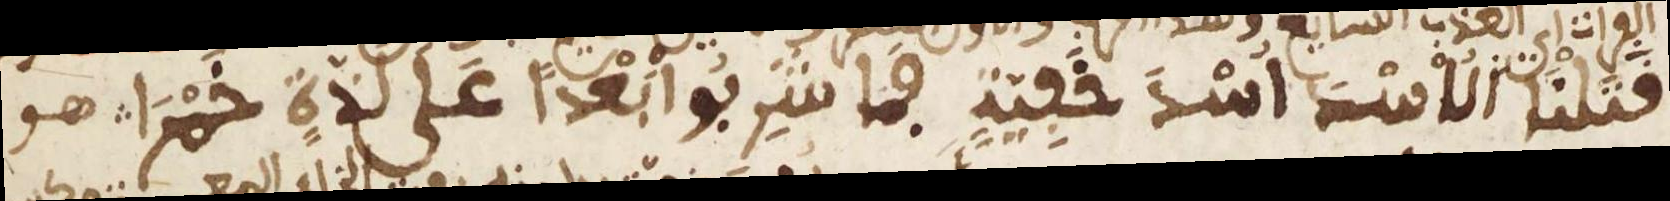قتلنا الاسد اسد خفية فما شربوا بعدا على لذة خمرا هو
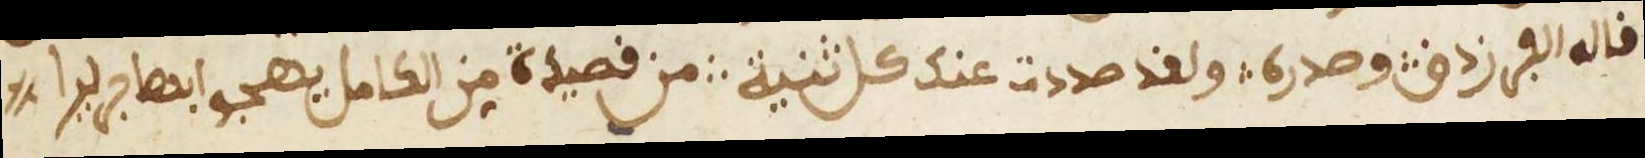قاله الفرزدق وصدره ولقد صددت عنك كل ثنية من قصيدة من الكامل يهجوا بها جريرا
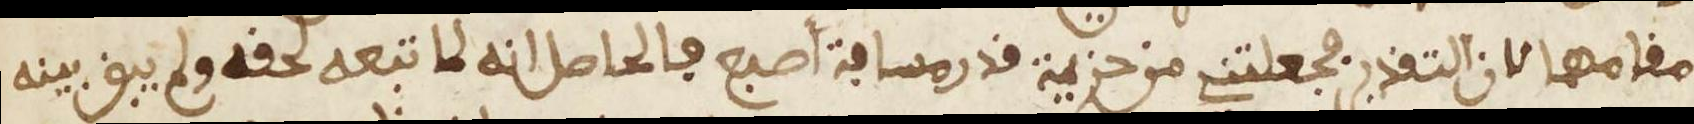مقامهما لان التقدير فجعلتني من حزيمة قدر مسافة أصبع فالحاصل انه لما تبعه لحقه و لم يبق بينه
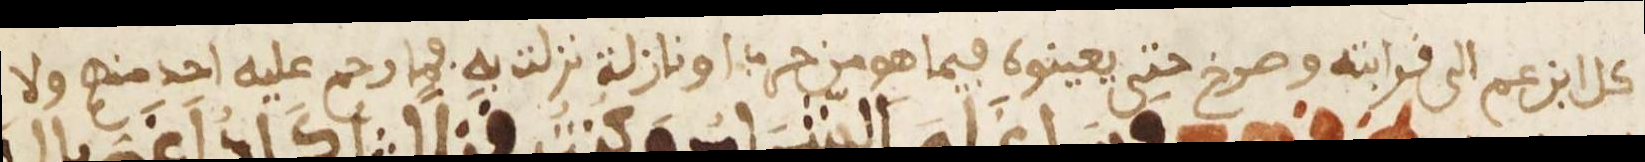كل ابن عم الى قرابته و صرخ حتى يعينوه فيما هو من حرب او نازلة نزلت به فما رحم عليه احد منهم و لا
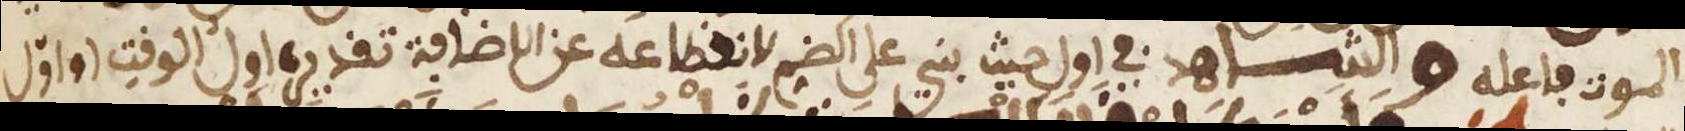الموت فاعله و الشاهد في اول حيث بني على الضم لانقطاعه عن الاضافة تقديره اول الوقت او اول
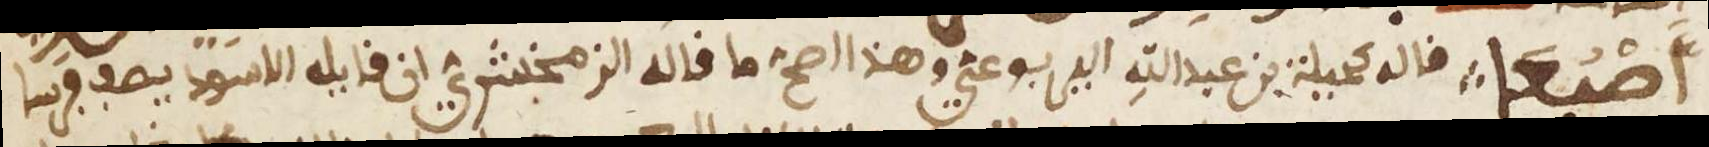أصبعا قاله كحيلة بن عبد الله اليربوعي و هذا اصح ما قاله الزمخشري ان قايله الاسود يصف فرسا
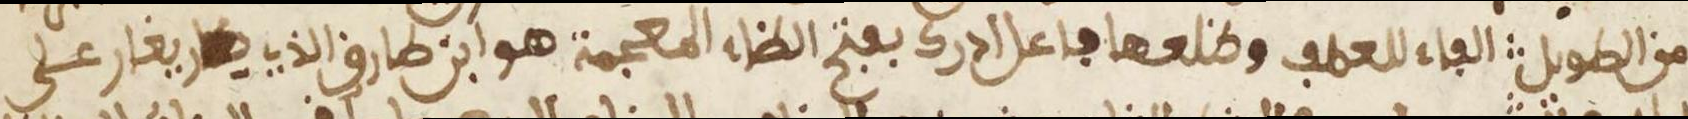من الطويل الفاء للعطف و ظلعها فاعل ادرك بفتح الظاء المعجمة هو ابن طارق الذي يغار على
